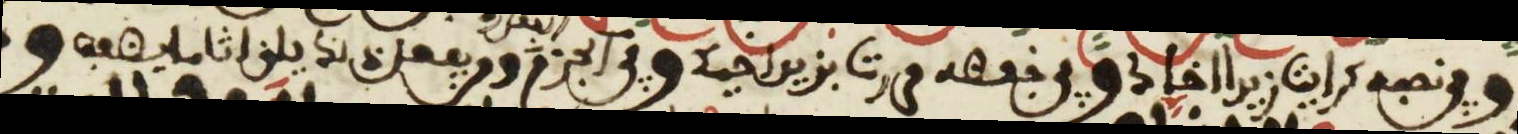و في نصبه كرايت زيدا اخاك وفي خفضه مررت بزيد اخيك و في الجزم و من يفعل ذلك يلن اثاما يضعف و
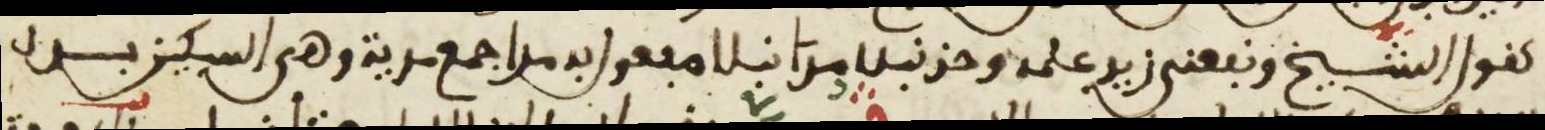كقول الشيخ و نفعنى زيد علمه و خذ نبلا مدا نبلا مفعول به مدا جمع مدية وهي السكين بدل
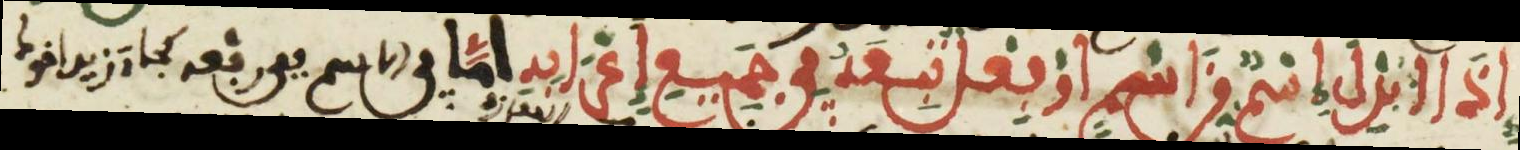إذا ابدل إسم من اسم او فعل تبعه في جميع إعرابه اما في الاسم ففى رفعه كجاء زيد اخوك
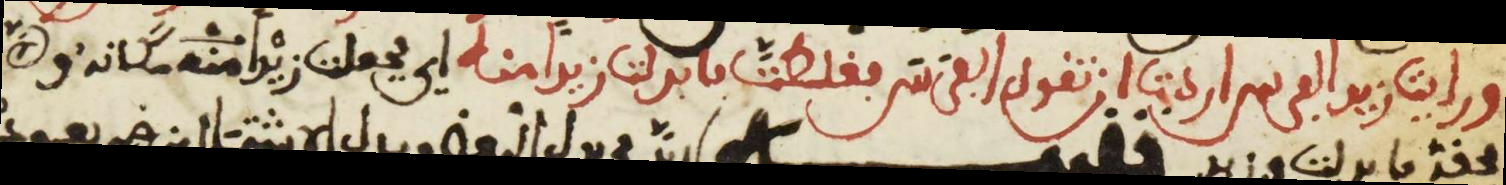و رايت زيد الفرس اردت ان تقول الفرس فغلطت فابدلت زيدا منه اي فجعلت زيدا منه مكانه و
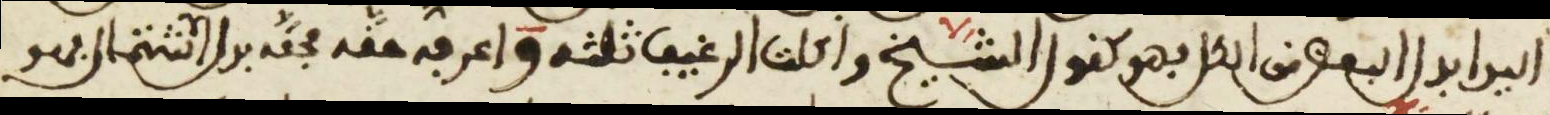اليدا بدل البعض من الكل فهو كقول الشيخ و اكلت الرغيف ثلثه و اعرفه حقه فحقه بدل الاشتمال فهو
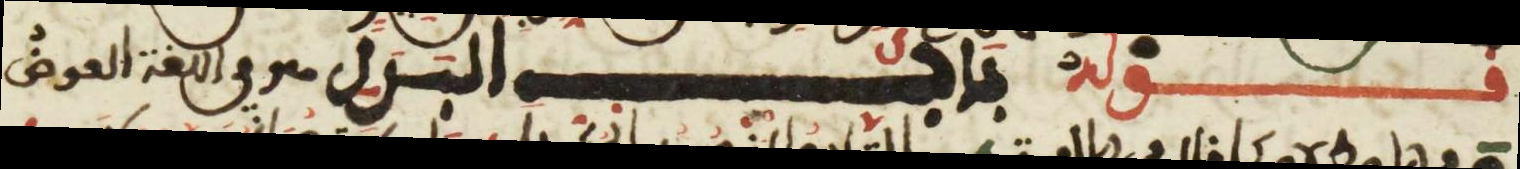قوله باب البدل # في اللغة العرض
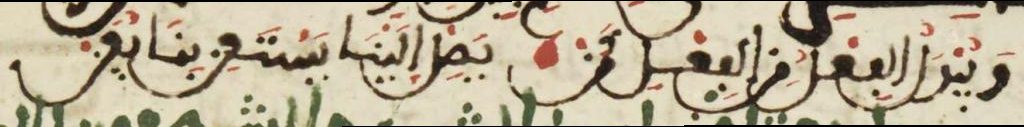و يبدل الفعل من الفعل كمن يصل إلينا يستعن بنا يعن
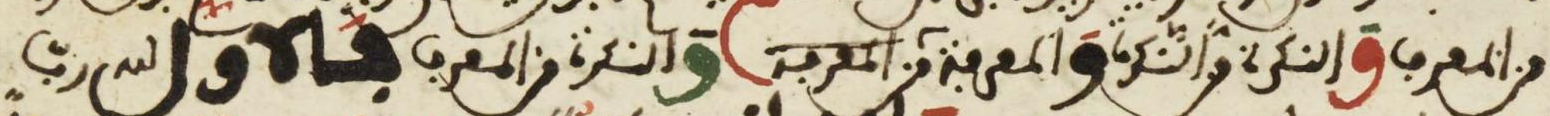من المعرف و النكرة من النكرة و المعرفة من المعرفة و النكرة من المعرف فالاول لله رب
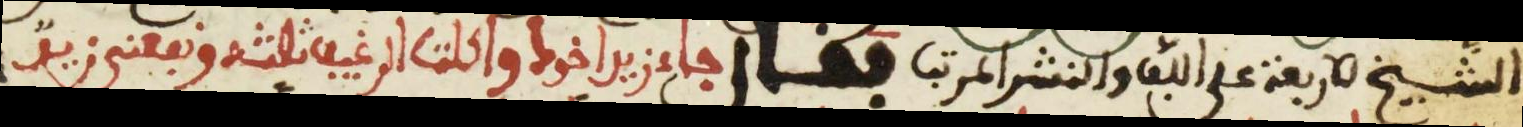الشيخ الاربعة على اللف و النشر المرتب فقال جاء زيدا اخوك و اكلت الرغيف ثلثه و نفعني زيد
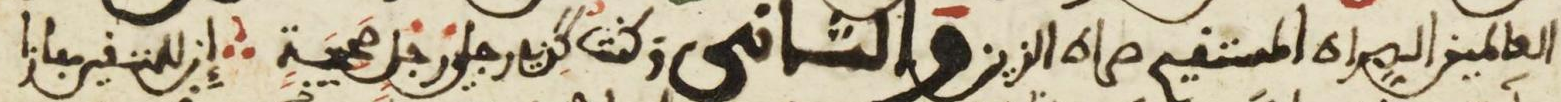العالمين الصراط المستقيم صراط الذين و الثاني و كنت كزيد رجلي رجل صحيحة ان للمتقين مفازا
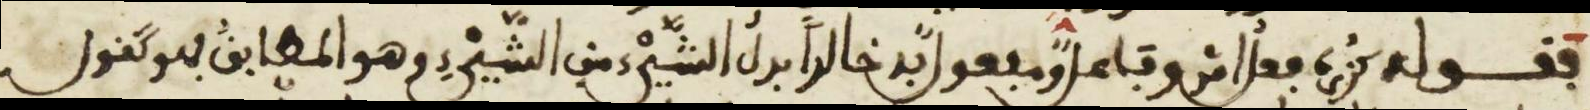فقوله كزره فعل امر و فاعل و مفعول به خالدا بدل الشيء من الشيء و هو المطابق فهو كقول
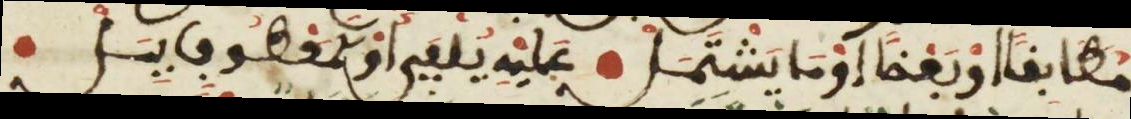مطابقا او بعضا او ما يشتمل عليه يلفي أو كمعطوف ببل
